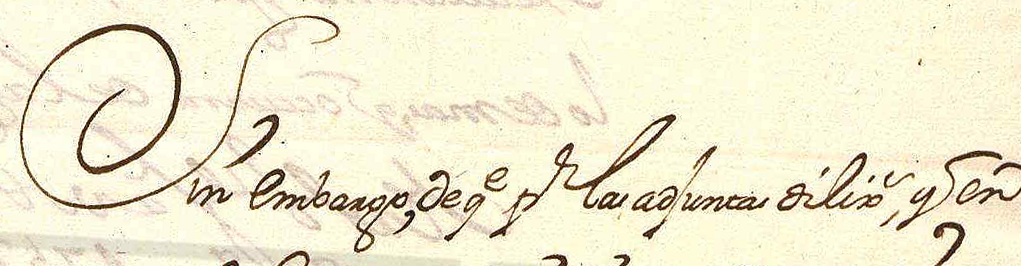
Sin embargo, de qe por las adjuntas di lixa, q̄ en
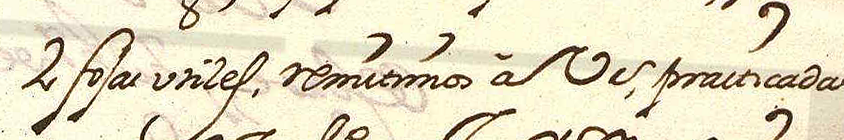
2 fojas vtiles, remitimos à Vs, practicadas
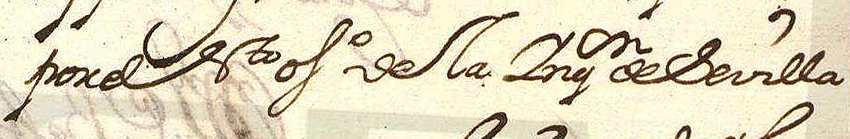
por el Sto ofo de la Ynqon de Sevilla
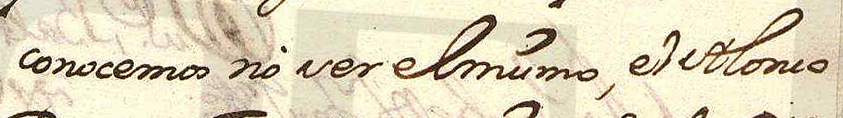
conocemos no ser el mismo, el Alonso
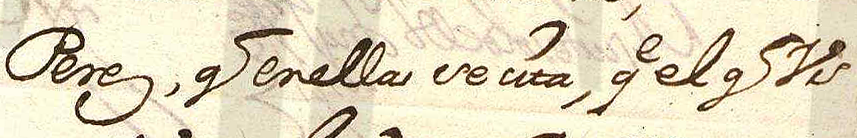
Perez, q̄ en ella se cita, qe el q̄ Vs
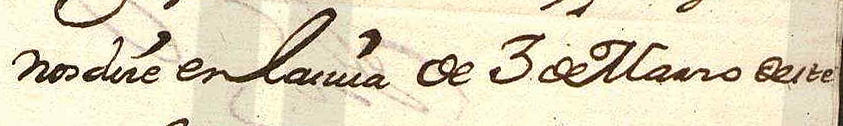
nos dize en la suia de 3 de Marzo deste
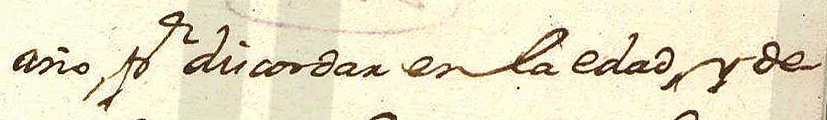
año, por discordar en la edad, y de
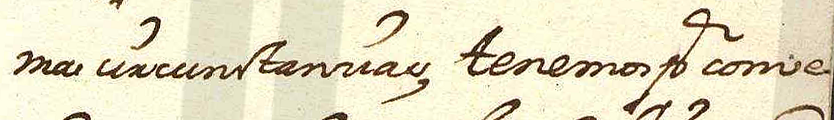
mas circunstancias, tenemos por conve
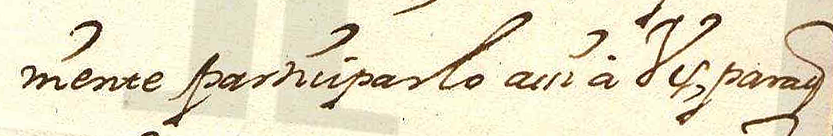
niente participarlo assi a Vs, para q̄
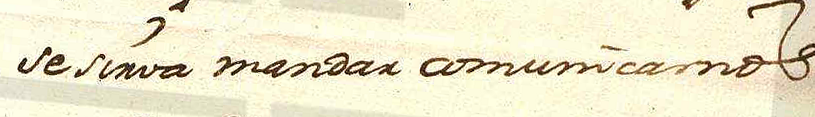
se sirva mandar comunicarnos
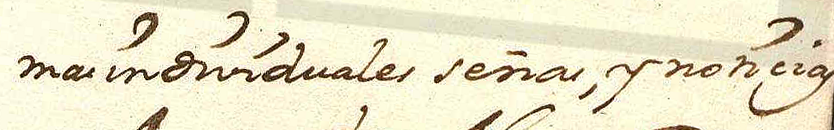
mas individuales señas, y noticias
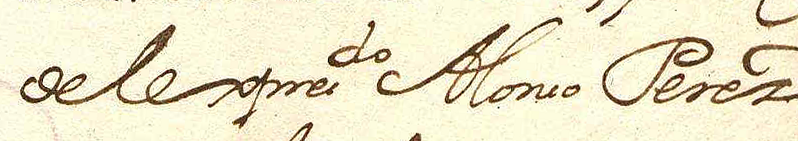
del expresdo Alonso Perez
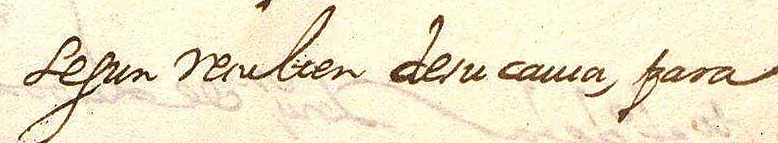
segun resultem de su causa, para
